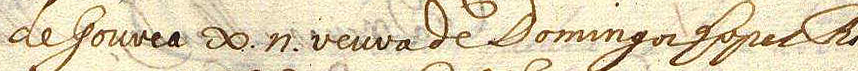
de Gouvea x. n. veuva de Domingos Lopes Ri
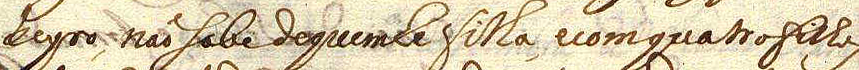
beyro, naõ sabe de quem he filha, e com quatro filhos
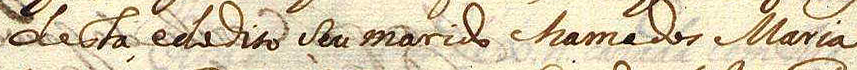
desta, e do dito seu marido chamados Maria
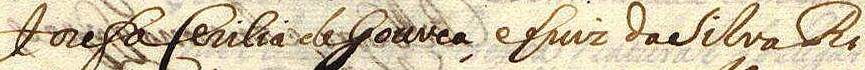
Iozefa Cezilia de Gouvea, e Luiz da Silva Ri
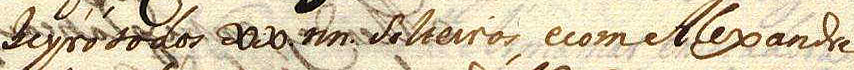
beyro todos xx. nn. solteiros, e com Alexandre
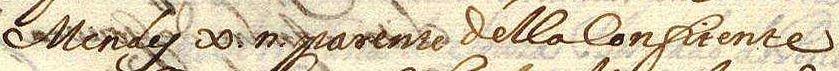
Mendes x. n. parente della confitente
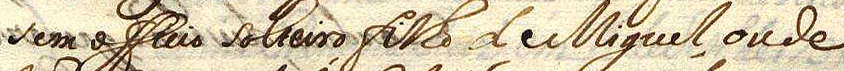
sem officio solteiro, filho de Miguel, ou de
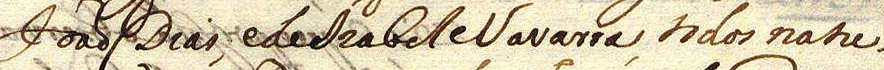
João Dias, e de Izabel Navarra, todos natu
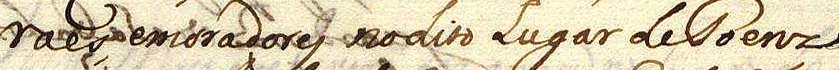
raes, e moradores no dito Lugar de Toenz
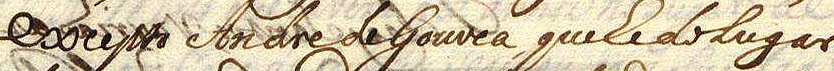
excepto Andre de Gouvea, que he do Lugar
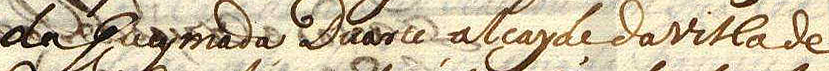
da Queymada Duarte alcayde da villa de
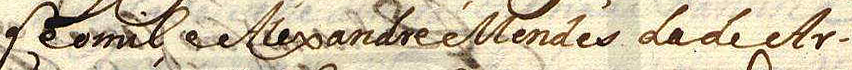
Leomil, e Alexandre Mendes da de Ar
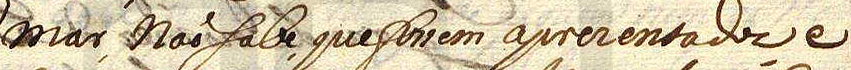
mar, naõ sabe, que fossem aprezentados, e
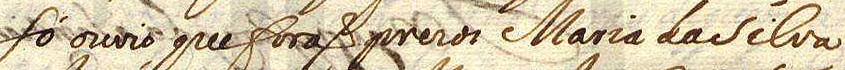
só ouvio, que foraõ prezos Maria da Silva,
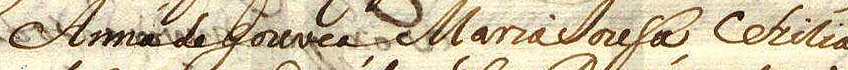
Anna de Gouvea, Maria Iozefa, Cezilia
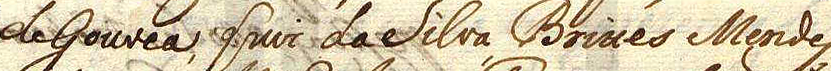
de Gouvea, Luiz da Silva, Brittes Mendes,
